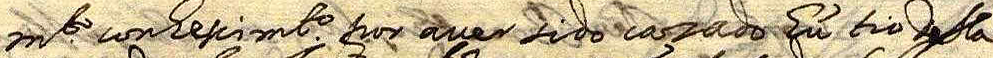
m.to conhescimt.o por auer sido cazado hū tio della
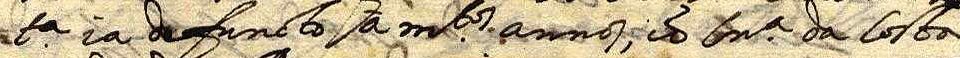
t.a ia defuncto à m.tos annos; cō Cn.a da Costa
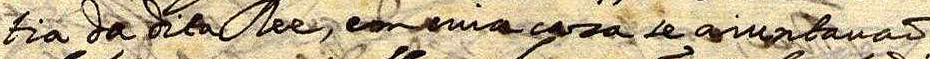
tia da dita Ree, em cuia caza se aiuntauaõ
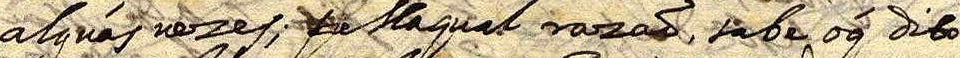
algūas vezes; pella qual razaõ, sabe o q̄ dito
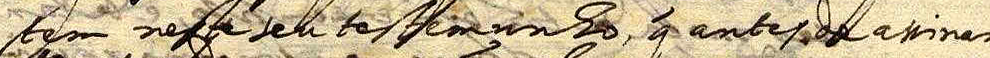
tem neste seu testemunho, q̄ antes de assinar
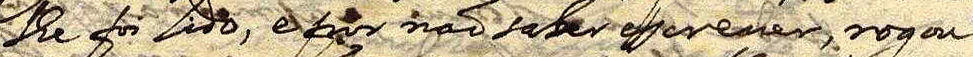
lhe foi lido, e por naõ saber escreuer, rogou
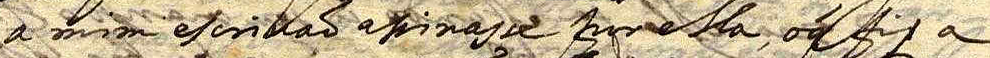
a mim escriuaõ assinasse por ella, o q̄ fis a
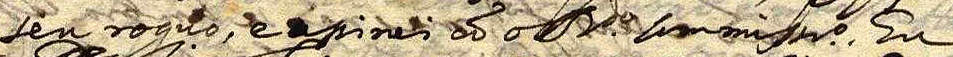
seu roguo, e assinei cō o R.do comissr.o Eu
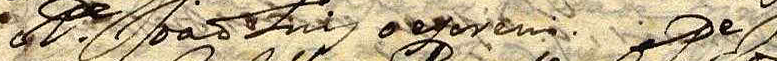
o P.e Joaõ Luis o escreuo.
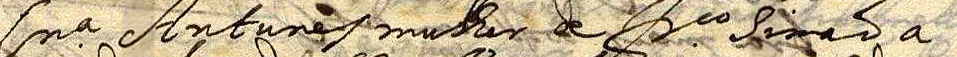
Cn.a Antunes mulher de fr.co Simaõ a
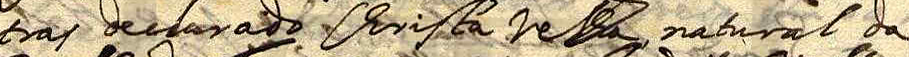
tras declarado Christã Velha, natural da
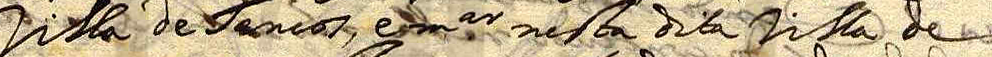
Villa de Tancos, e mar nesta dita Villa de
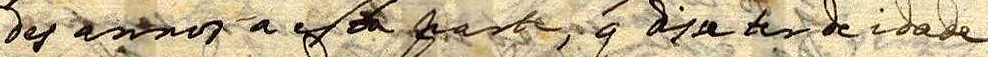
des annos a esta parte, q̄ disse ter de idade
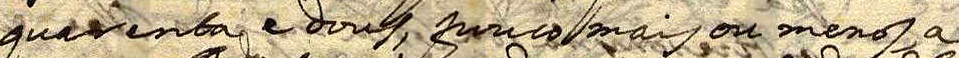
quarenta e dous, pouco mais ou menos, a
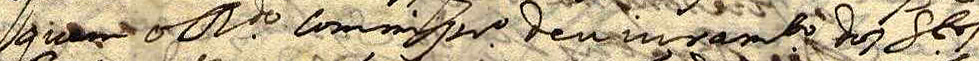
quem o R.do comissr.o deu iuramen.to dos S.tos
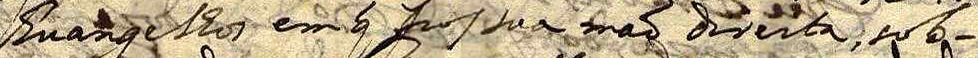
Euangelhos em q̄ sua maõ direita, sob
